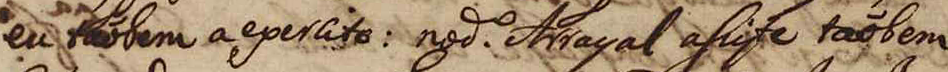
eu taõbem a exercito: no d.o Arrayal assiste taõbem
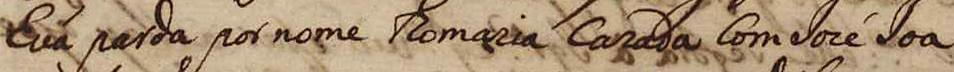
huā parda por nome Thomazia cazada com Iozé Ioa
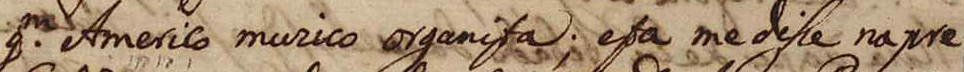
q.m Americo muzico organista; esta me disse na pre
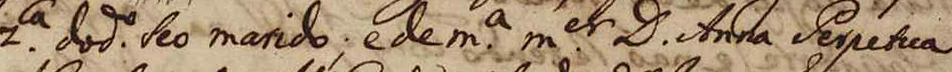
z.ca do d.o seo marido; e de m.a m.er D. Anna Perpetua
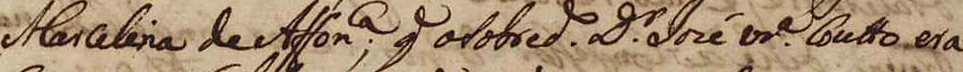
Marcelina de Affon;ca; q̄ o sobred.o D.r Iozé vr.a Couto era
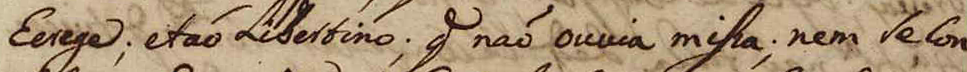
herege; e taõ Libertino; q̄ naõ ouuia missa; nem se con
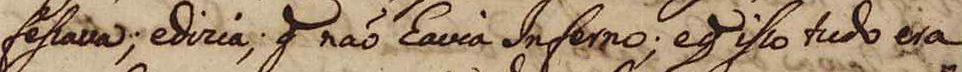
fessaua; e dizia; q̄ naõ hauia Inferno; e q̄ isso tudo era
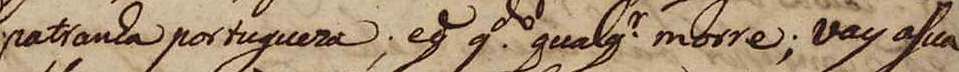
patranha portugueza; e q̄ q.do qualq.r morre; vay a sua
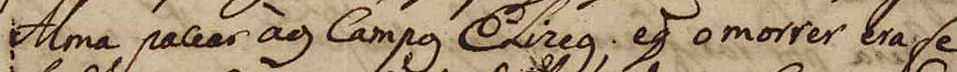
Alma pacear àos Campos ELizeos; e q̄ o morrer era fe
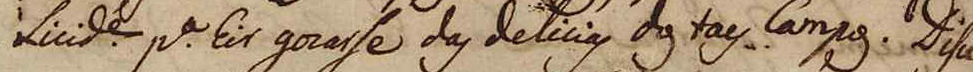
Licid.e p.a hir gozarse das delicias dos taes Campos. Disse
